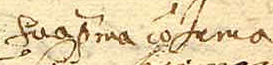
sua p̄ma cō Jrmã.
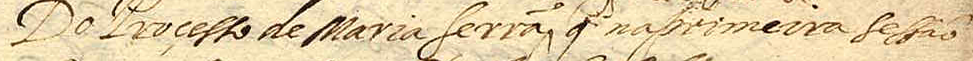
Do Proçesso de Maria Serrã q̄ na primeira sessaõ
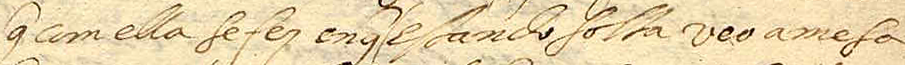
q̄ com ella se fez en q̄ Estando solta veo a mesa
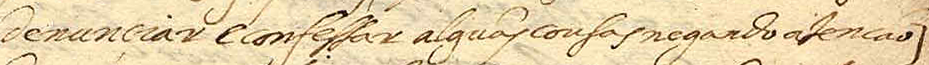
denunçiar e confessar alguās cousas negando atencão
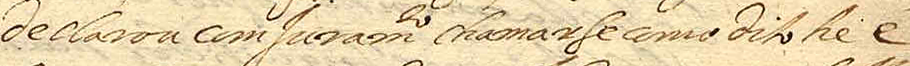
declarou com Juramto chamarse como dito he e
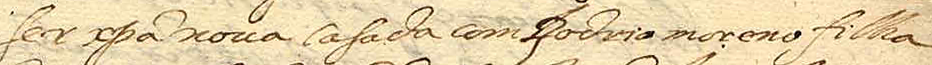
ser xpã noua casada com Rodrio moreno filha
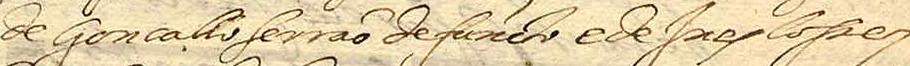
de Goncallo Serraõ defuncto e de Jnes lopez
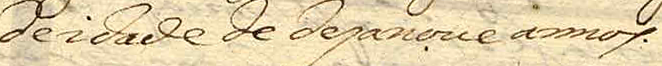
de idade de dezanoue annos.
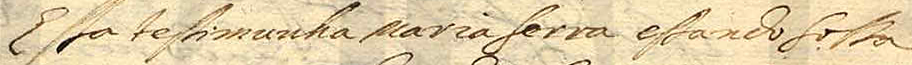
Esta testimunha Maria Serra estando solta
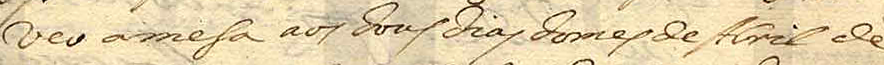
veo a mesa aos dous dias do mes de Abril de
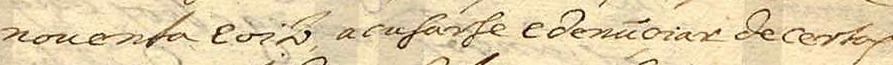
nouenta e oito, acusarse e denūciar de certas
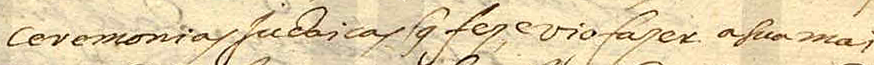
ceremonias judaicas q̄ fez, e vio fazer a sua mai
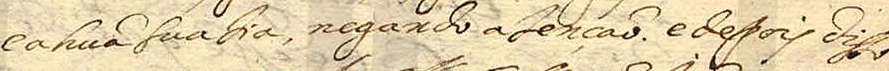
e a huā sua tia, negando atençaõ e depois disso
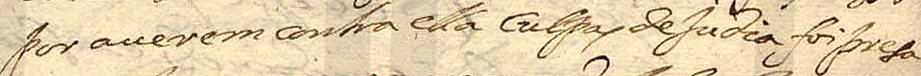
por auerem contra ella culpas de Judia foi presa
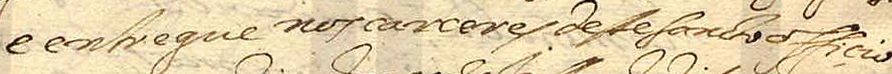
e entregue nos carceres deste Sancto offiçio
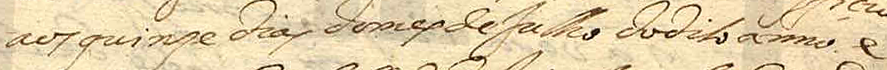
aos quinze dias do mes de Julho do dito anno e
